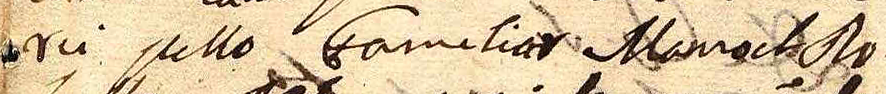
rei pello Familiar Manoel Ro
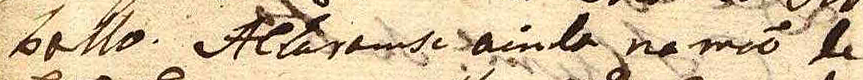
ballo. ACharamse ainda na maõ de
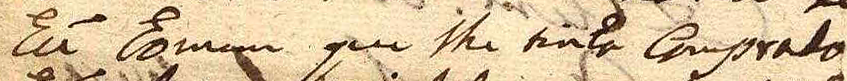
hū homem que lhe tinha Comprado
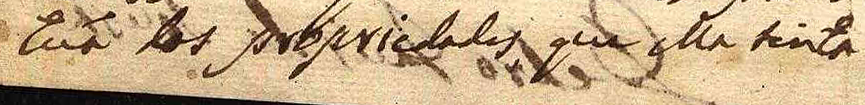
huā das propriedades que ella tinha
